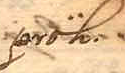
proh.
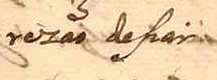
rezaõ de fiar
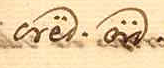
cred. ord.
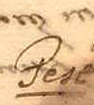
Testa. 4
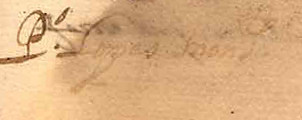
P.o Lopes monsto.
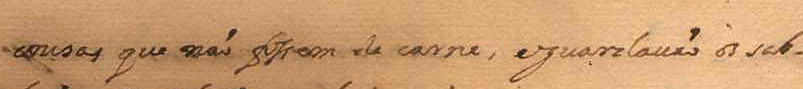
cousas que naõ fossem de carne, e guardauaõ os sab
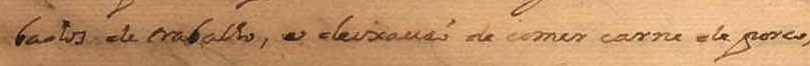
bados de trabalho, e deixauaõ de comer carne de porco,
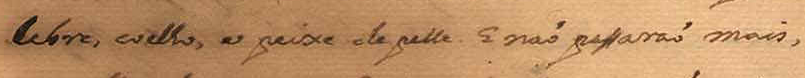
lebre, coelho, e peixe de pelle. E naõ passaraõ mais,
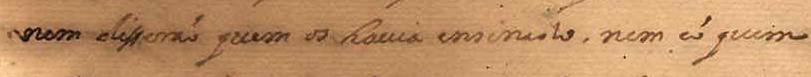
nem disseraõ quem os hauia ensinado, nem cō quem
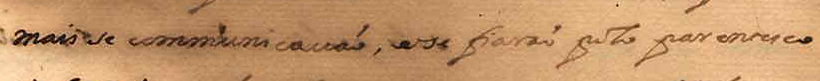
mais se communicauaõ, e se fiaraõ pelo parentesco
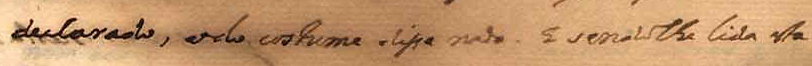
declarado, e do costume disse nada. E sendolhe lida esta
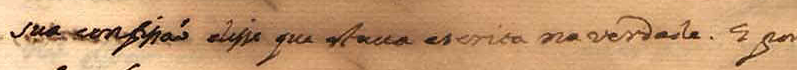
sua confissaõ disse que estaua escrita na verdade. E por
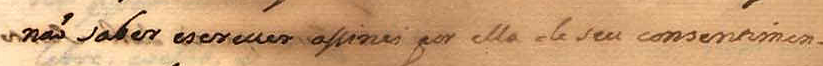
naõ saber escreuer assinei por ella de seu consentimen
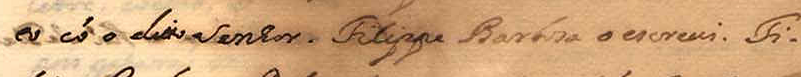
to cō o ditto Senhor. Filippe Barboza o escreui. Fi
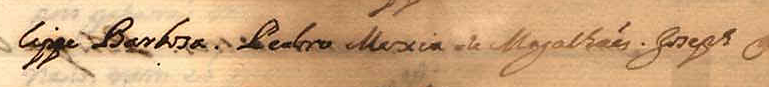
lippe Barbosa. Pedro Mexia de Magalhaes Joseph C
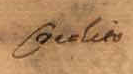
Credito
